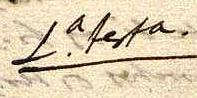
1.a testa.
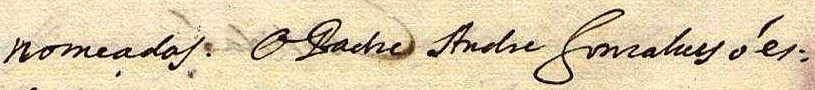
nomeadas. O Padre Andre Gonsalues o es
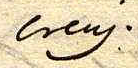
creuj.
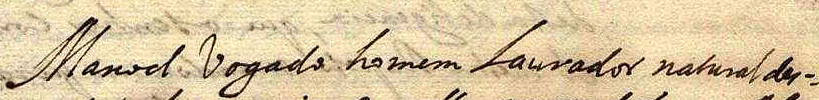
Manoel Vogado homem laurador natural des
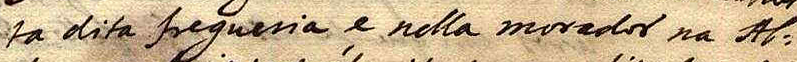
ta dita freguezia, e nella morador na Al
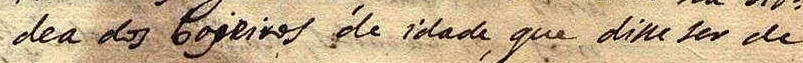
dea dos bajeiros de idade, que disse ser de
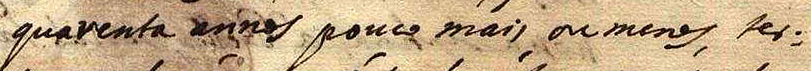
quarenta annos pouco mais, ou menos, tes
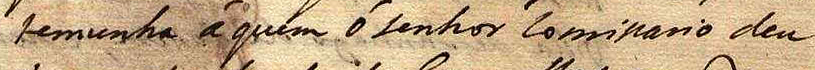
temunha a quem o senhor comissario deu
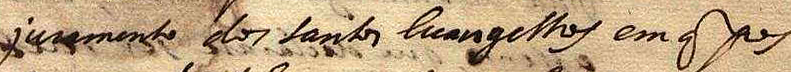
juramento dos santos Euangelhos em q̄ pos
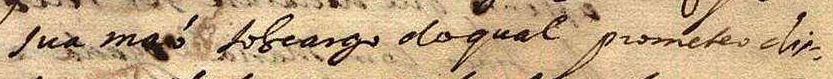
sua maõ sob cargo do qual prometeo dis
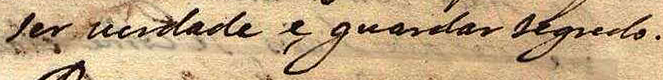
ser uerdade e guardar segredo.
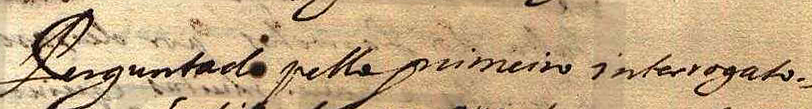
Perguntado pello primeiro interrogato
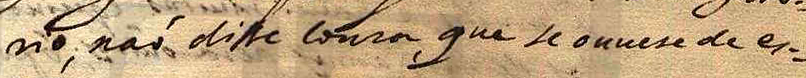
rio, naõ disse couza que se ouuese de es
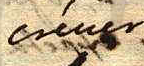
creuer.
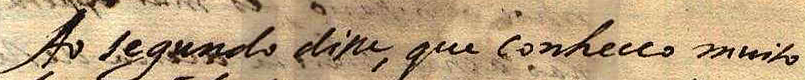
Ao segundo disse, que conheceo muito
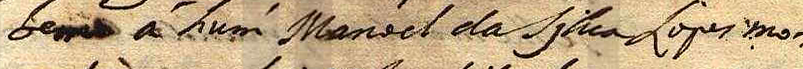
bem a hum Manoel da Sjlua Lopes mo
